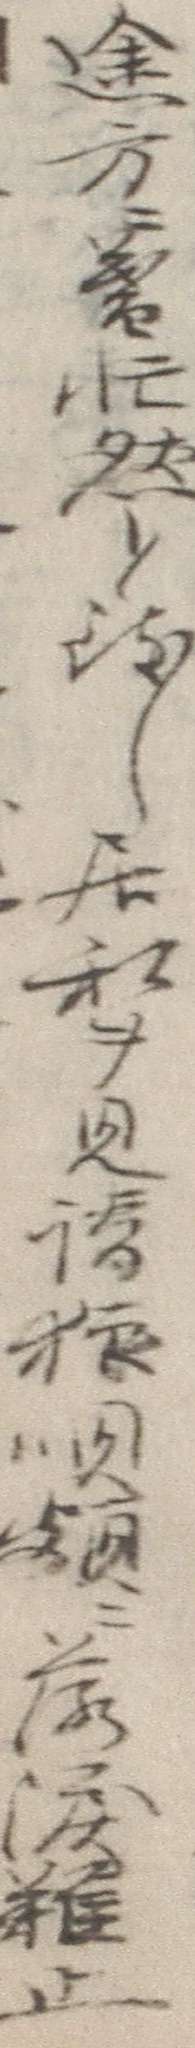途方ニ暮茫然と致し居私ヲ見請狼狽頻ニ落涙難止
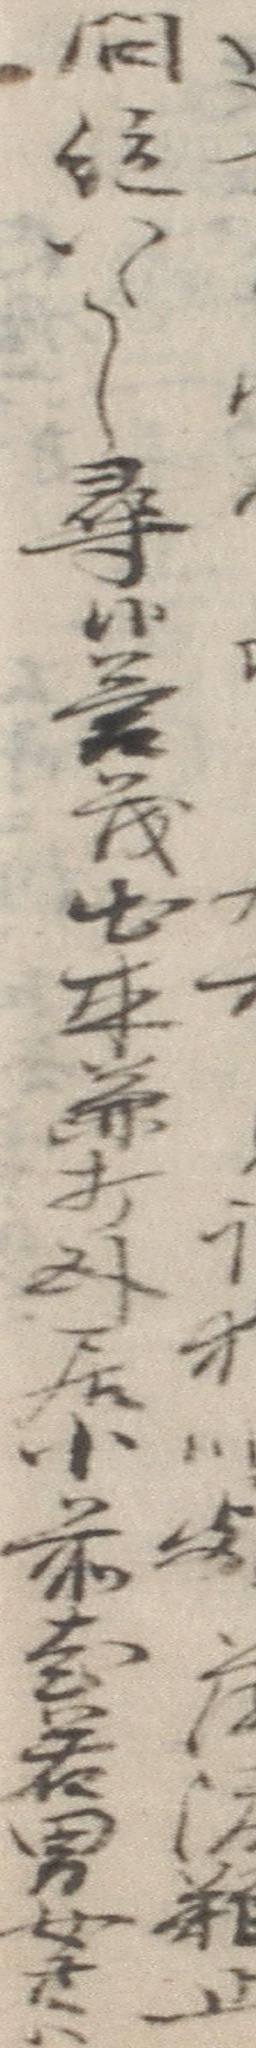悶絶いたし尋候答も出来兼打臥居小前老若男女共ハ
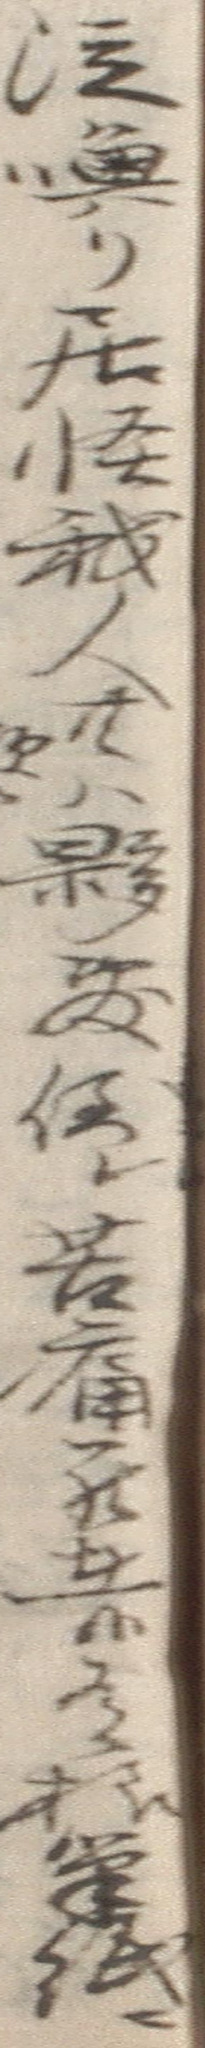泣噢り居怪我人共ハ夥敷倒レ苦痛罷在候有之様筆紙ニ
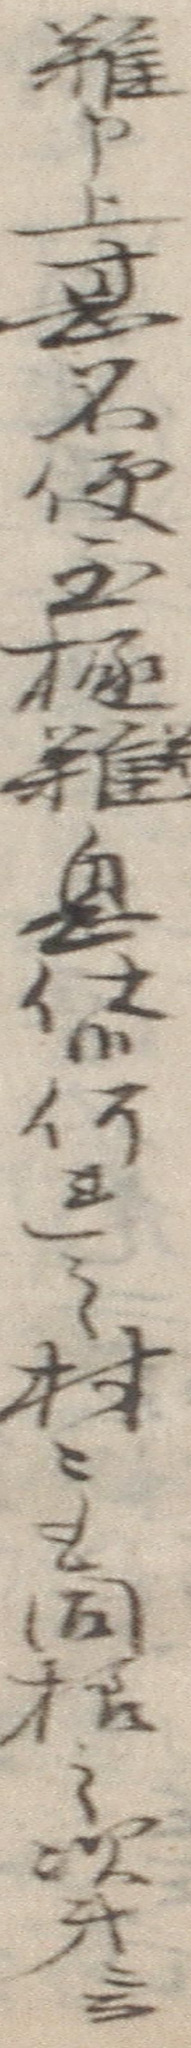難申上甚不便至極歎息仕候何れ之村々も同様之次第ニ而
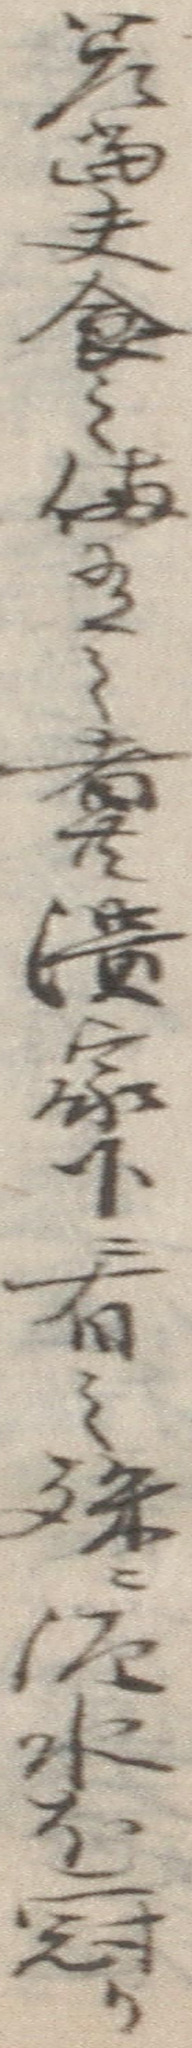差当夫食之備有之者共潰家下ニ有之殊ニ泥水を冠り
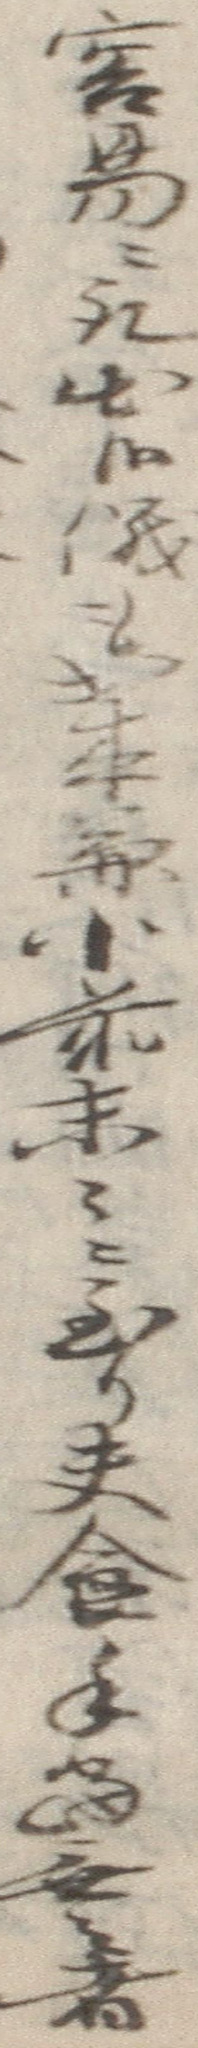容易ニ取出候義も出来兼小前末々ニ至り夫食手当無之者
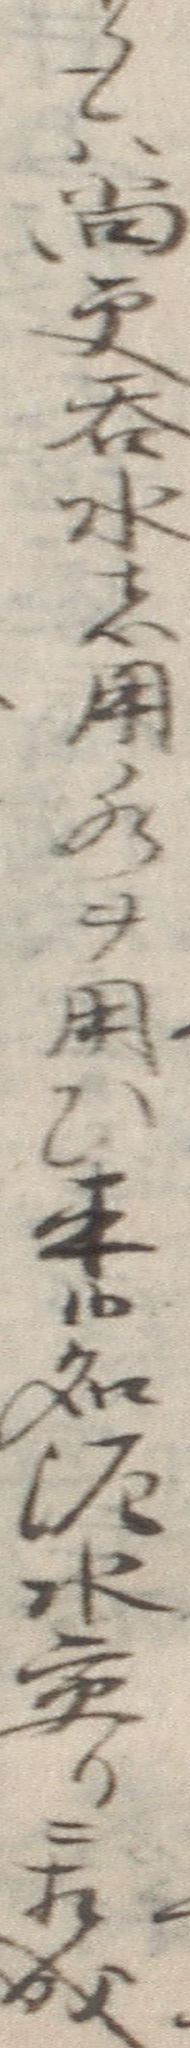ともハ尚更呑水は用水を用ひ来候処泥水交りニ相成
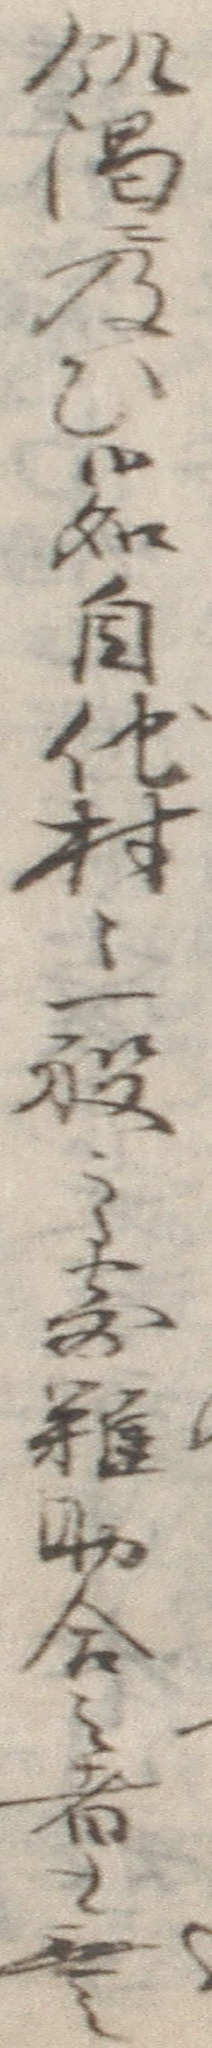飢渇ニ及ひ候処自他村々一般之寄難助合之者も無之
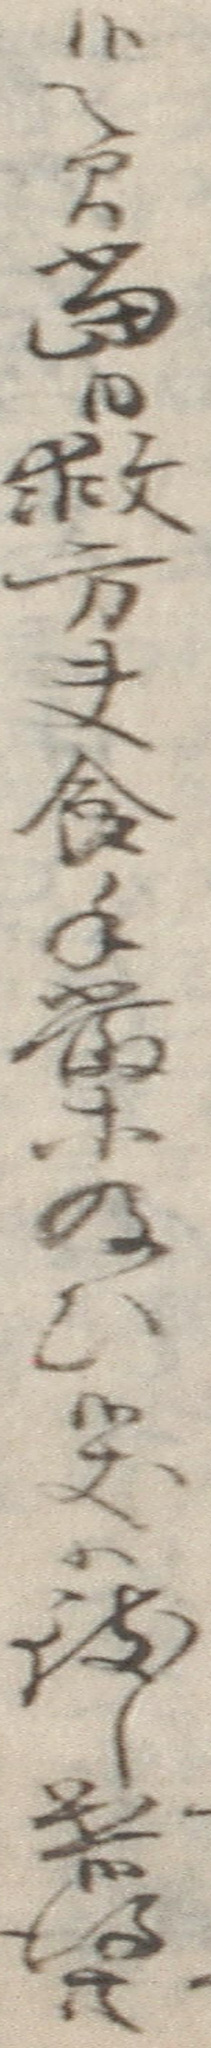候之間当日救方夫食手当等及ひ候丈ハ致し暮候得共
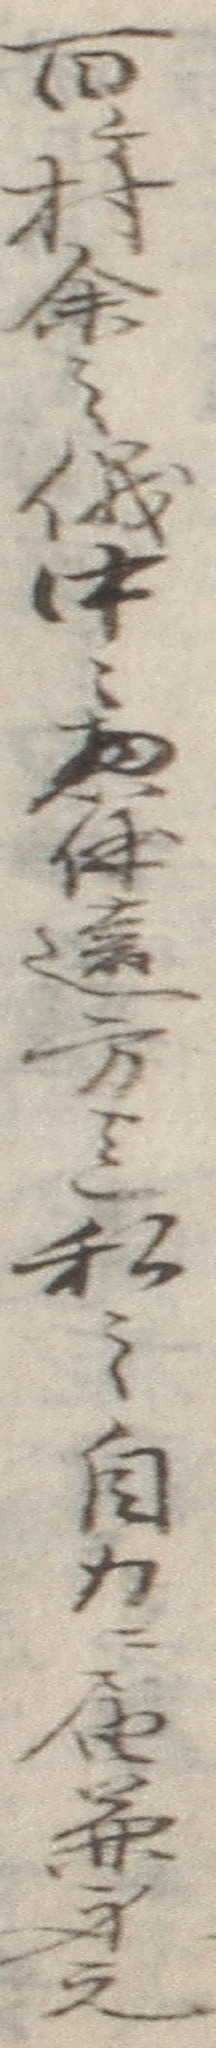百ケ村余之儀中々惣体遠方迄私之自力ニ届兼身元
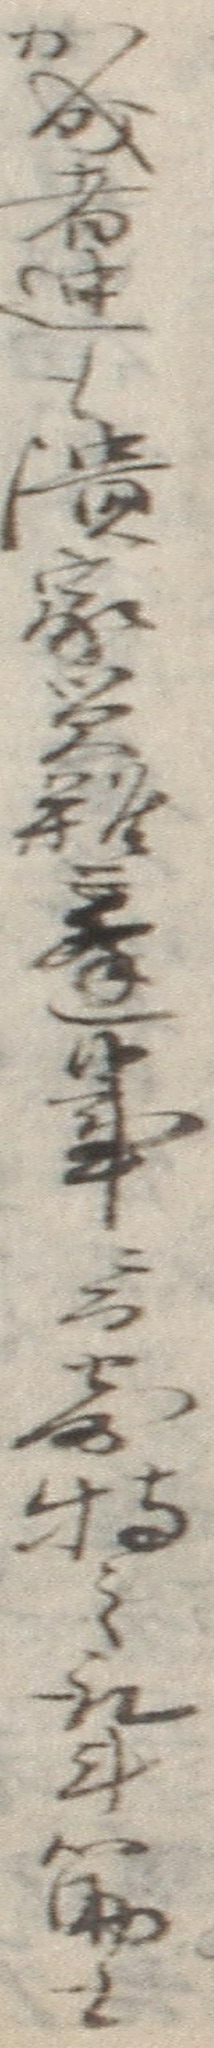可成者迚も潰家災難ニ逢申候事ニ而奇特之取斗筋も
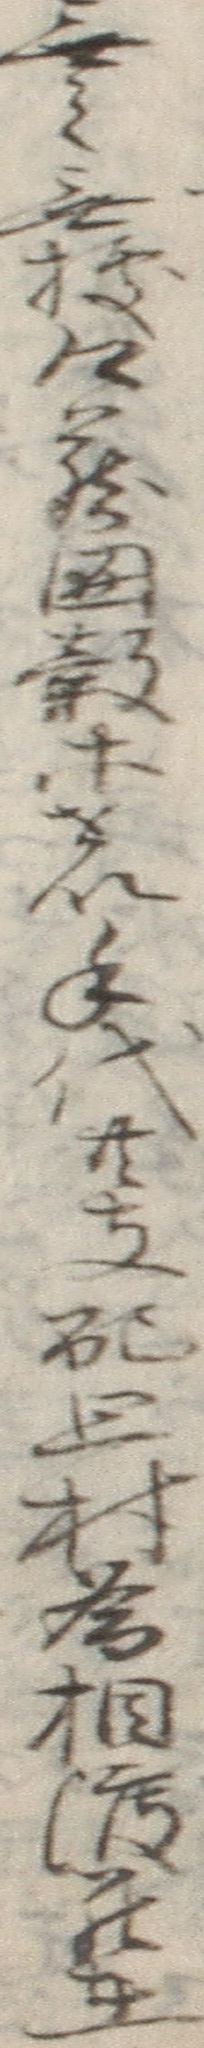無之無拠郷蔵囲穀等を以手代共支配廻村為相渡罷在
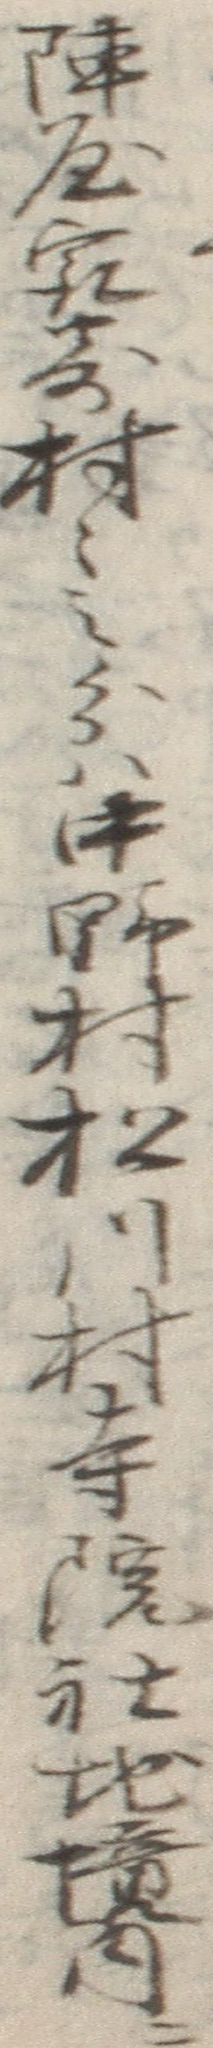陣屋最寄村々之分ハ中野村松川村寺院社地境内ニ
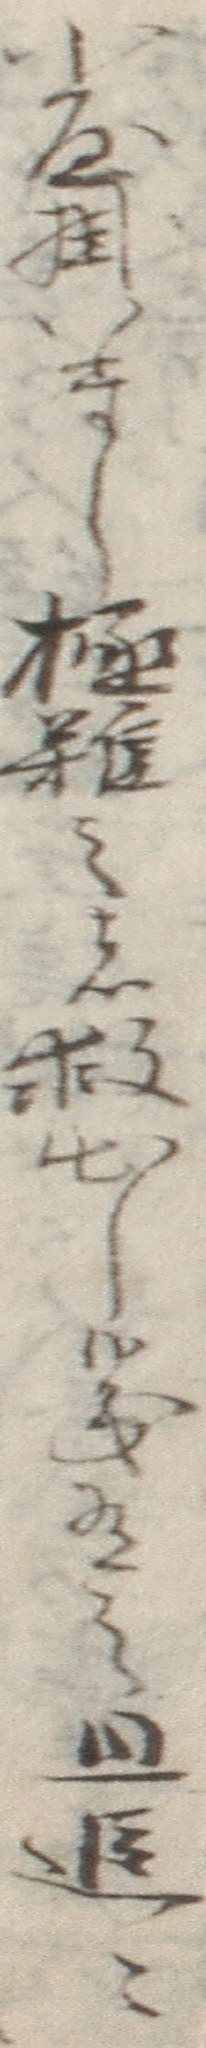小屋掛いたし極難之者救出し候義有之且追々
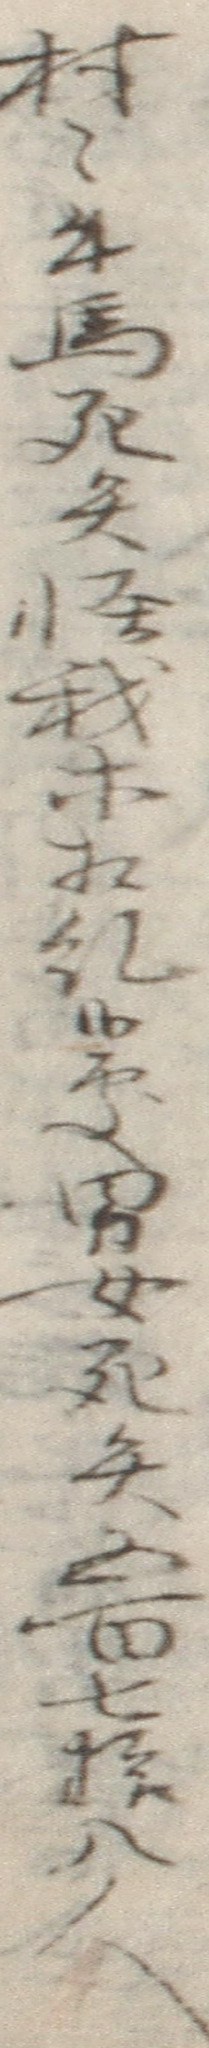村々牛馬死失怪我等相糺候処男女死失五百七拾八人
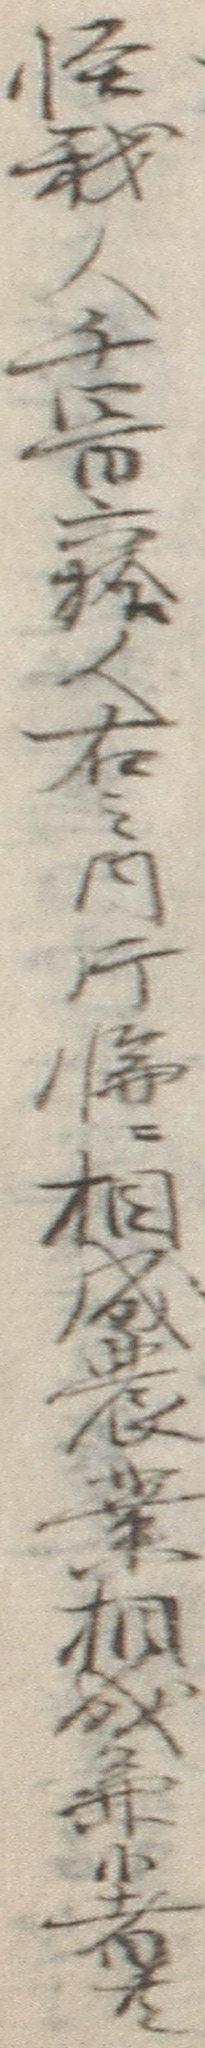怪我人千四百六拾人右之内片輪ニ相成農業相成兼小者共
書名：[善光寺地震に関する冊子]
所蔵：東京大学地震研究所図書室 Earthquake Research Institute Library, The University of Tokyo, JAPAN
